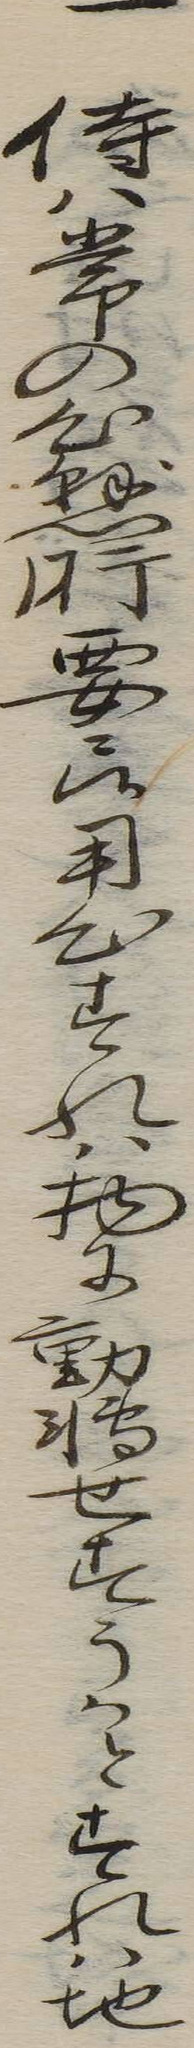一侍は常の心懸肝要ニ候用心すれは物に動転せすうかとすれは地
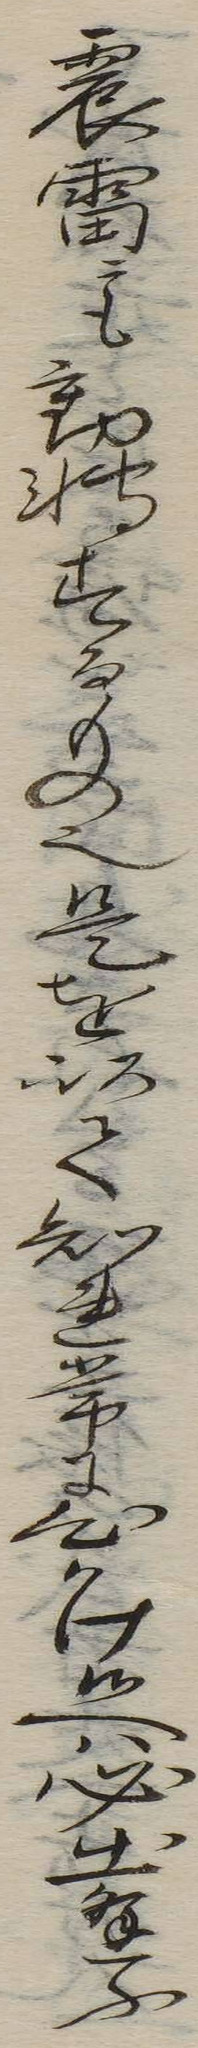震雷ニも動転するもの也是を以て知れ常に心かけ候へは必出逢ふ
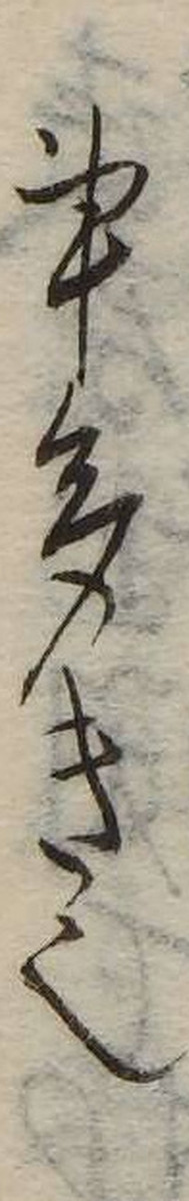事多き也
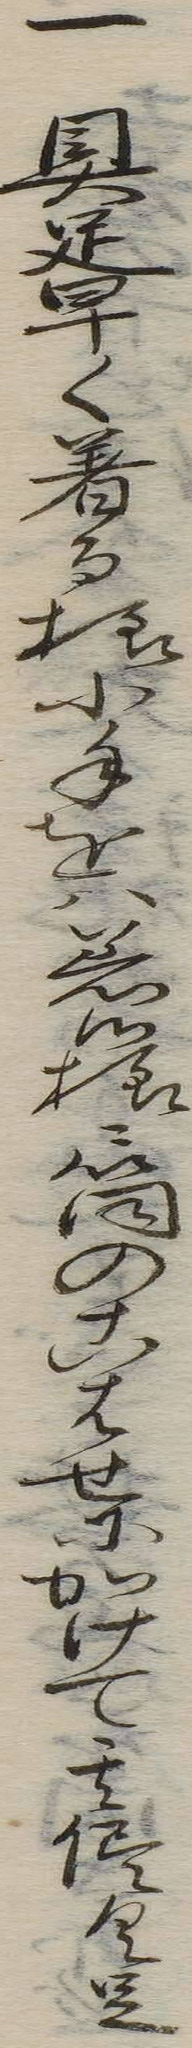一具足早く着る様小手をは着候様に筒のこはせにかけて其侭具足
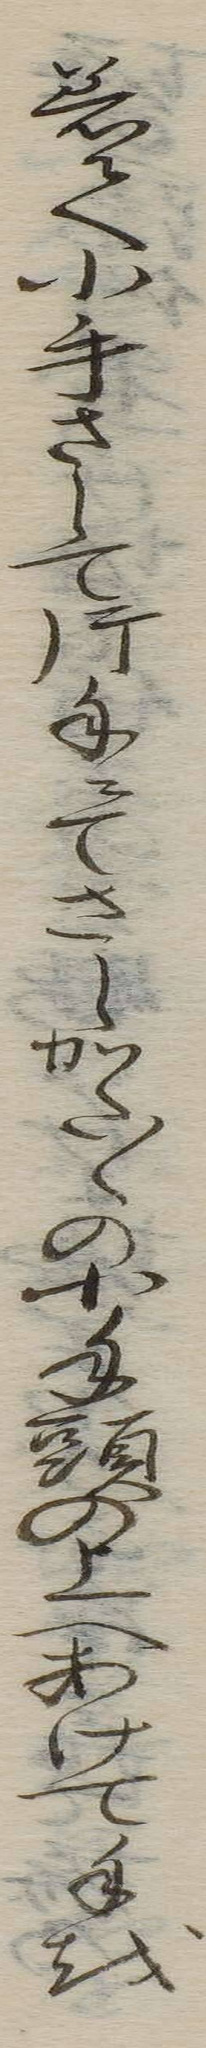着て小手さして片手ニてさしかた〳〵の小手頭の上へあけて手を
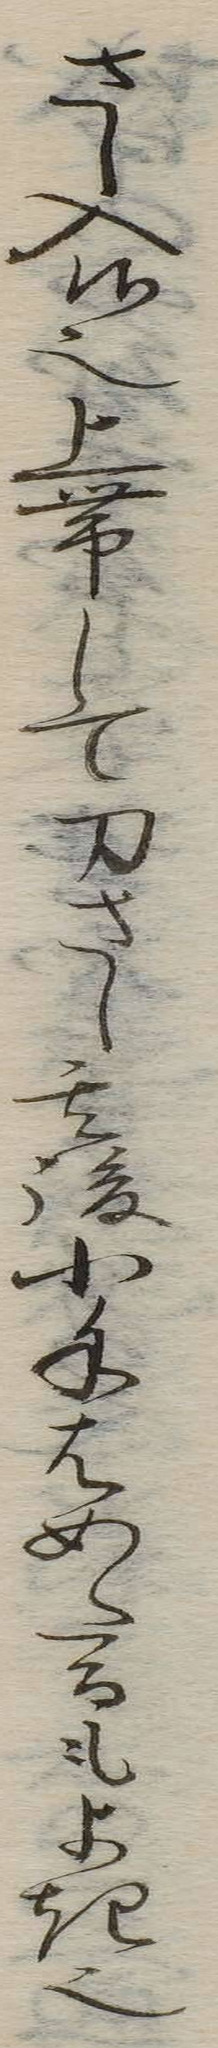さし入候也上帯して刀さし其後小手はめたるもよき也
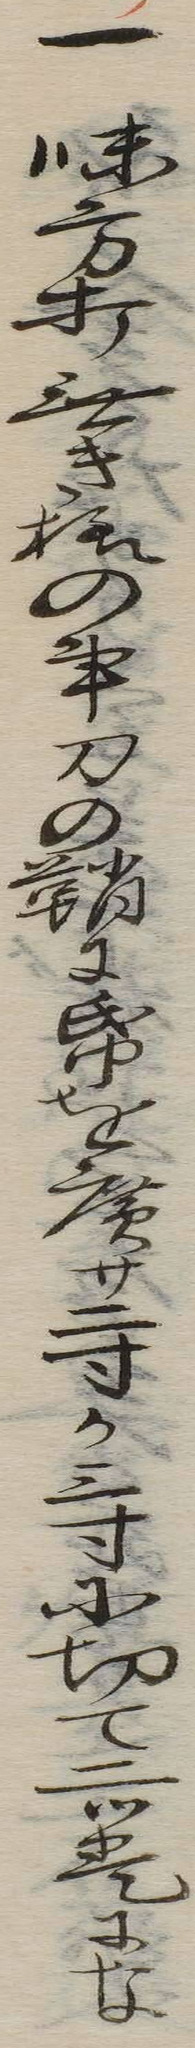一味方打無き様の事刀の鞘に帋を広サ二寸か三寸に切て二ツ巻にな
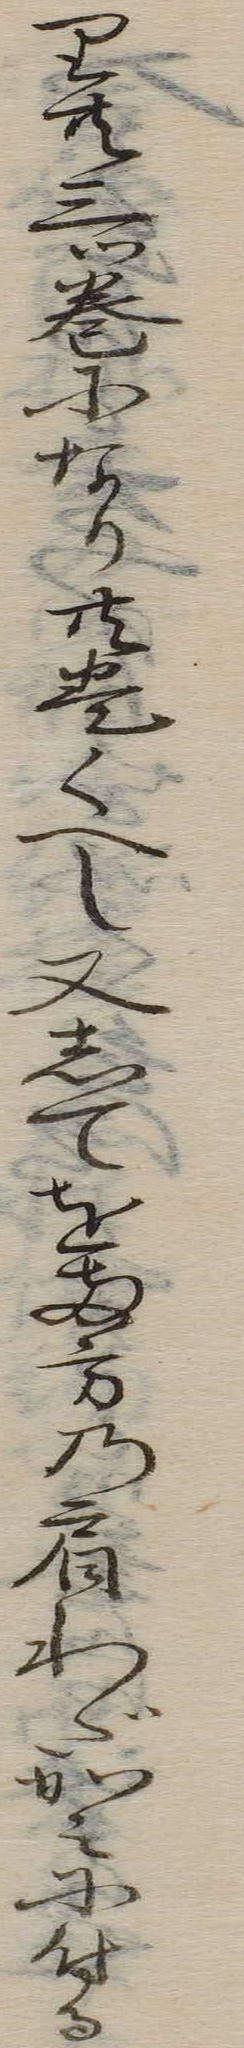り共三ツ巻になり共巻くへし又してを両方の肩わだかみに付る
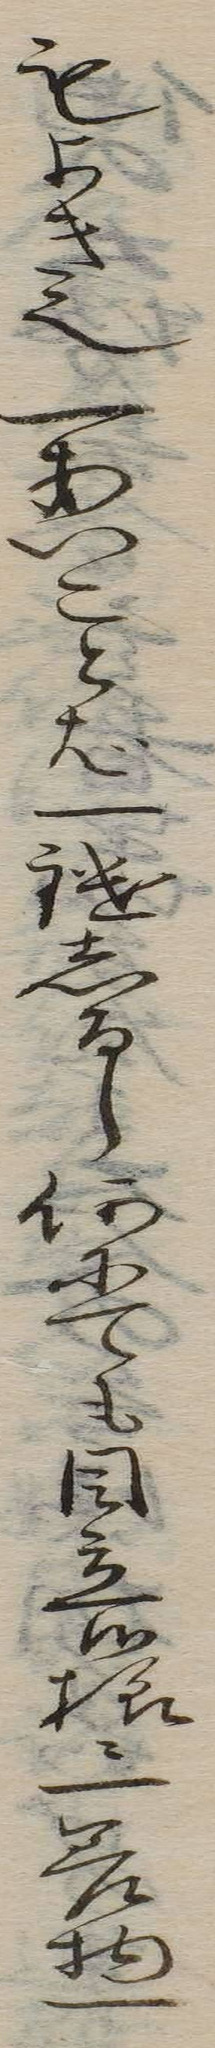もよき也一あひことば一鑓しるし何にても目立候様ニ一差物一
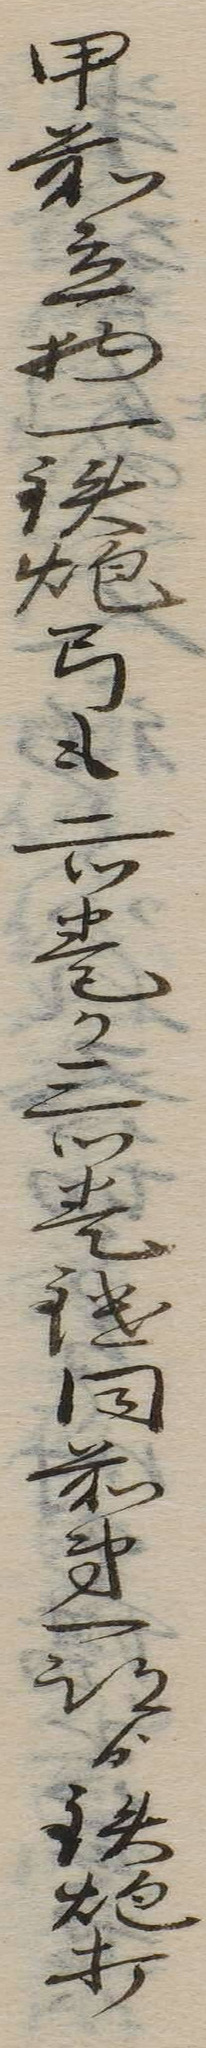甲前立物一鉄炮弓も二ツ巻か三ツ巻鑓同前第一跡ゟ鉄炮打
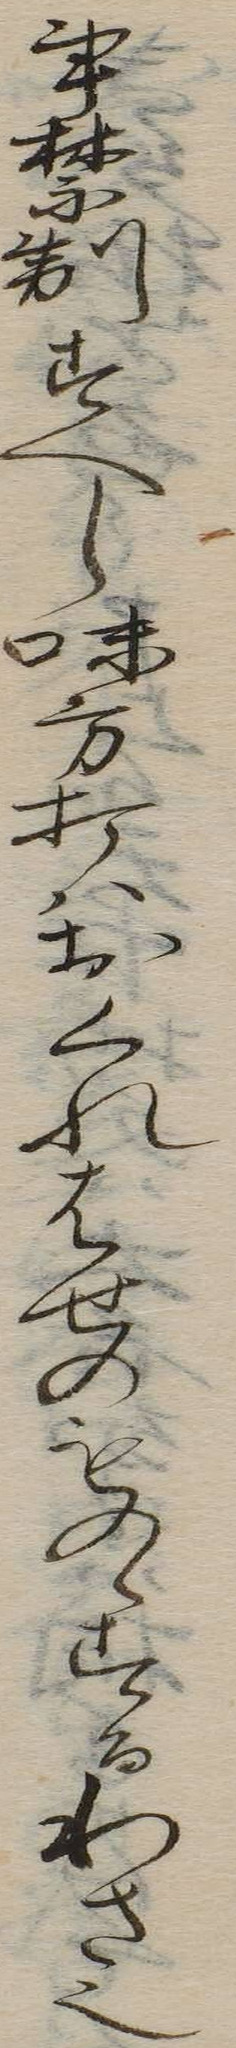事禁制すへし味方打はおくれはせのものゝするわさ也
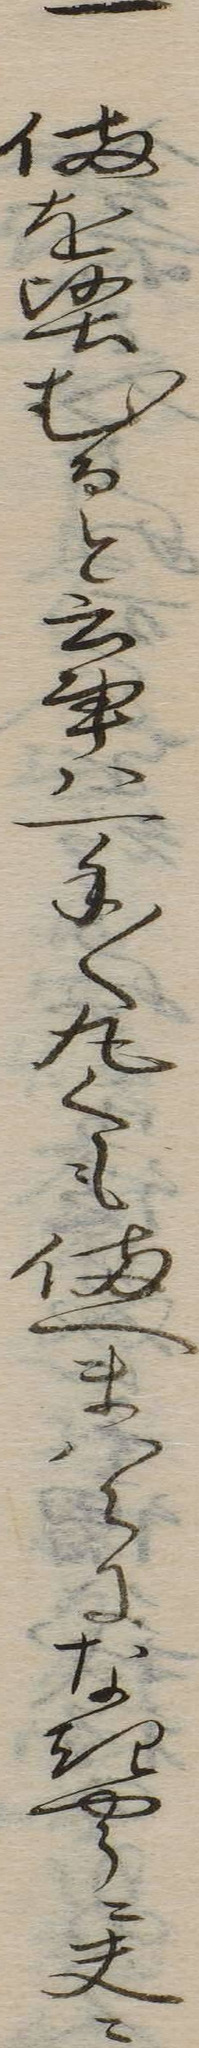一備を堅むると云ふ事は一手〳〵丸くも備へまはらになきやうニ夫々
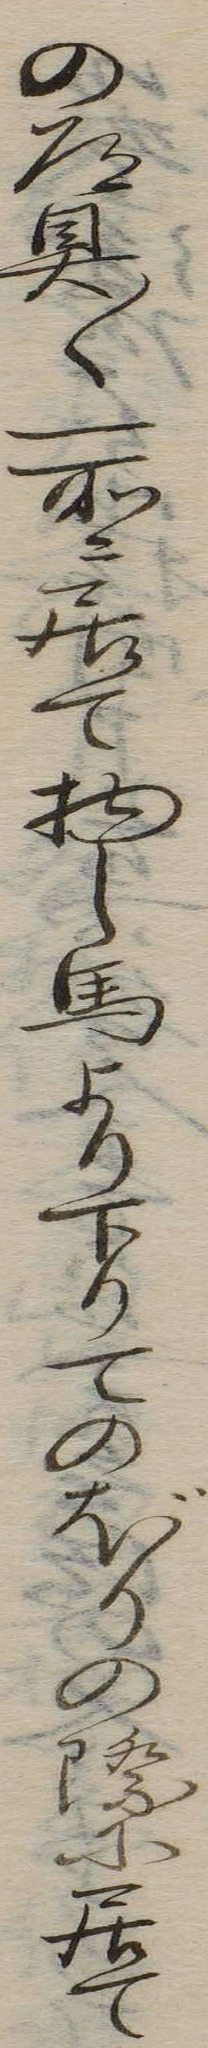の道具〳〵一所に居て物し馬より下りてのぼりの際に居て
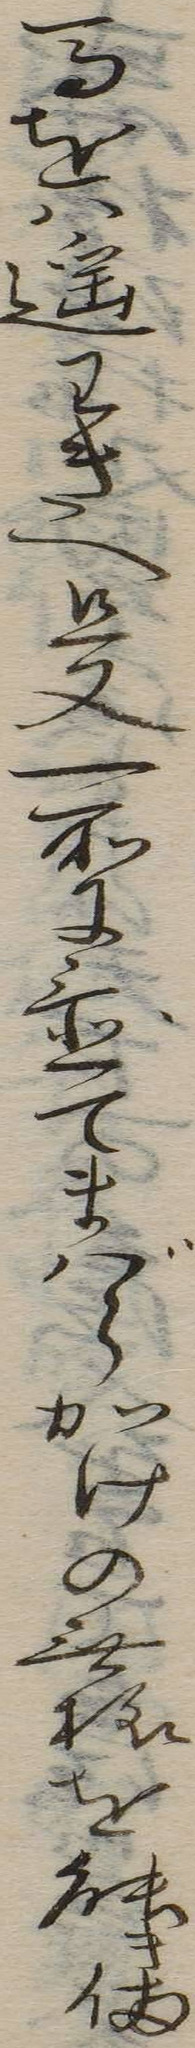馬をは遥わきへ且又一所に置てまばらかけの無様を能き備
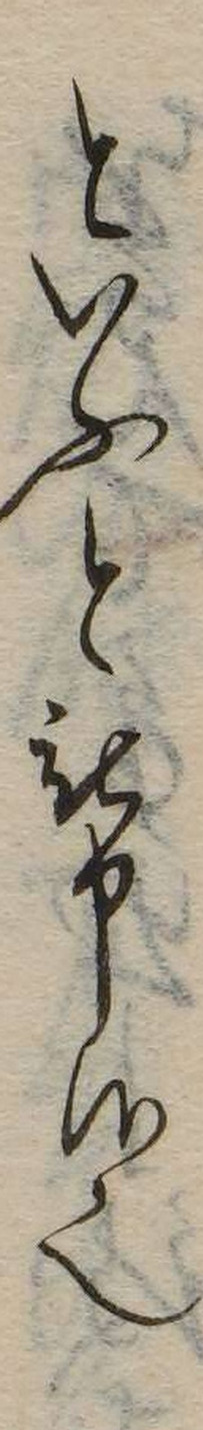といふと被申候也
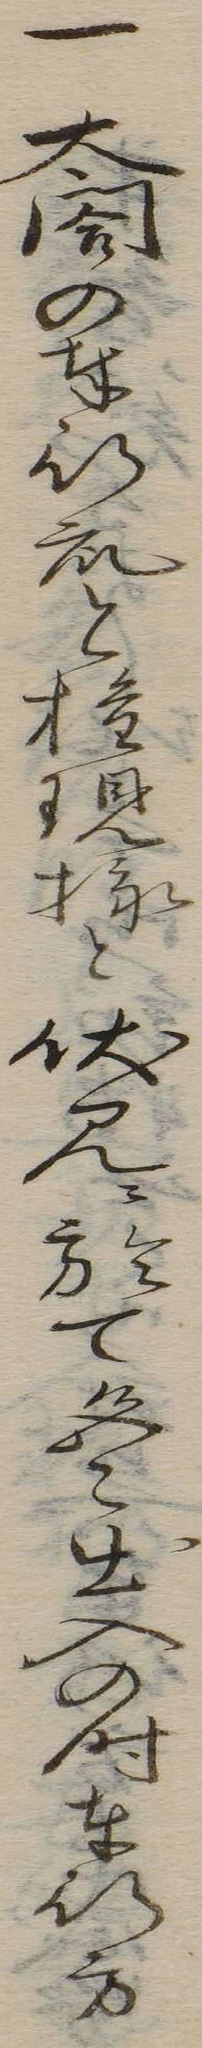一太閤の奉行衆と権現様と伏見に於て色々出入の時奉行方
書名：三河之物語
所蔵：国文学研究資料館
